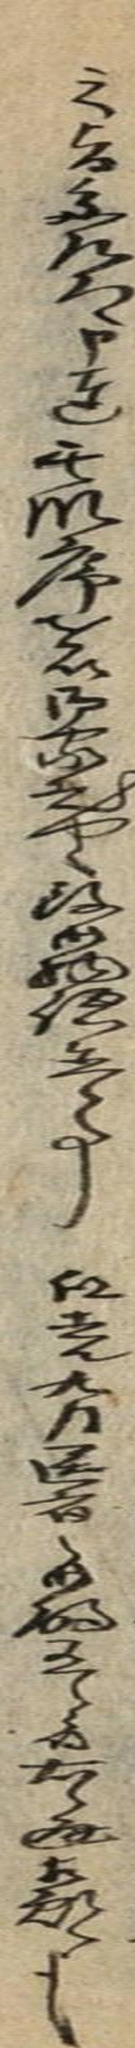之旨多左衛門へ申達其段序を以御家老中へ致御物語置候事但去ル九月医者之御触有之ニ付右之通相願候よし
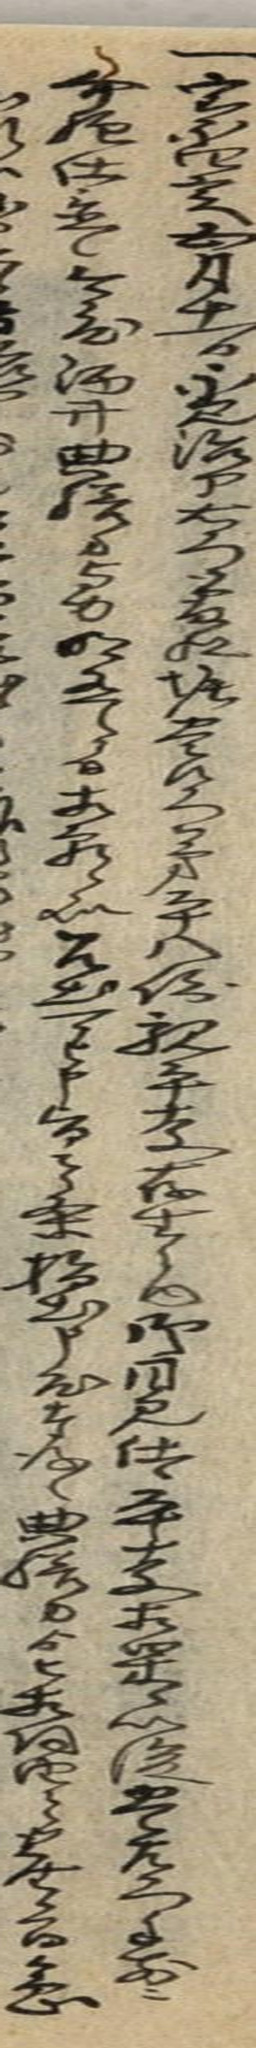介抱仕置候今度酒井典膳方与力明有之候ニ付相願候処召出可被申旨之条指出申度奉存候典膳方ゟ被相伺由ニ御座候間急
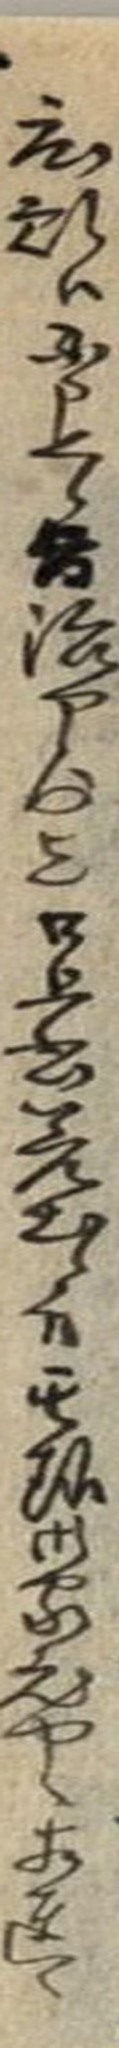度願ハ不申上候旨治部右衛門迄口上書差出候ニ付其趣御家老中ヘ相達候
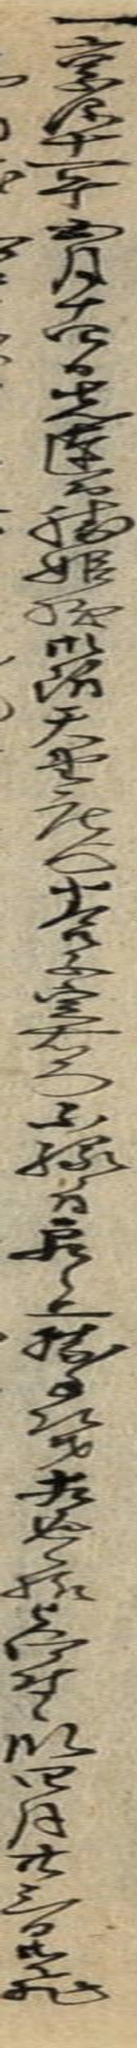一享保十一午五月十四日先達而勝姫様御附天野庄右衛門養子定右衛門不縁ニ付願之上勝手次第相返候様被仰付候段四月廿三日飛
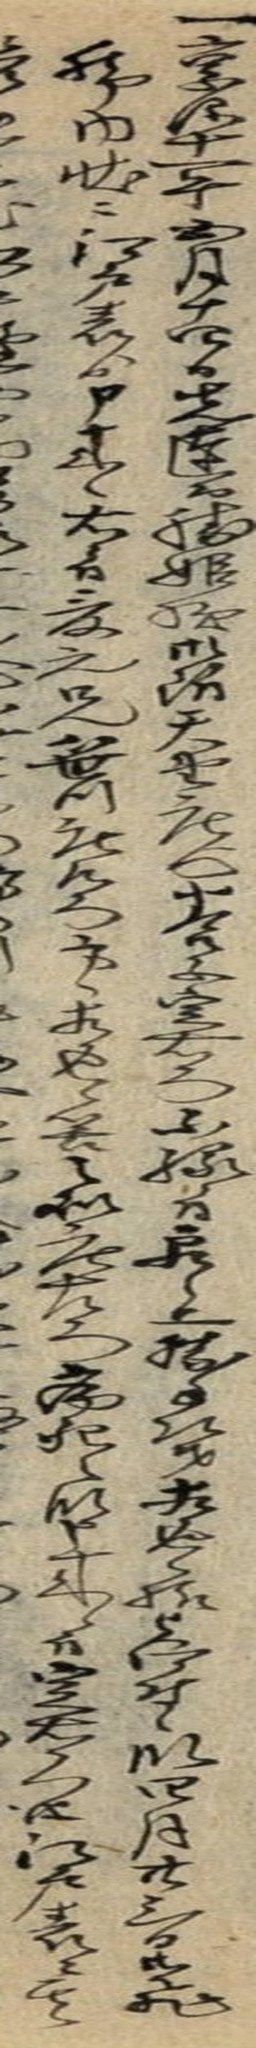脚内状ニ江戸表ゟ申来候右ニ付爰元兄笹川庄左衛門方へ相返候筈之処庄左衛門病死之段申来候ニ付定右衛門儀江戸表ニ其
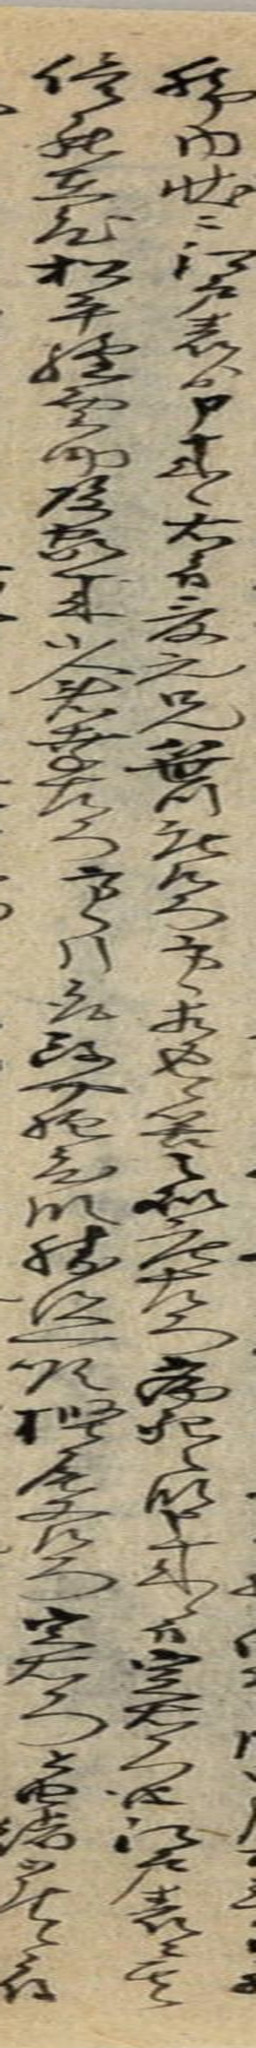儘罷在度松平縫殿助殿家来小倉幸左衛門方へ引取致介抱度段勝沢一順樫尾又左衛門定右衛門と由緒御座候ニ付
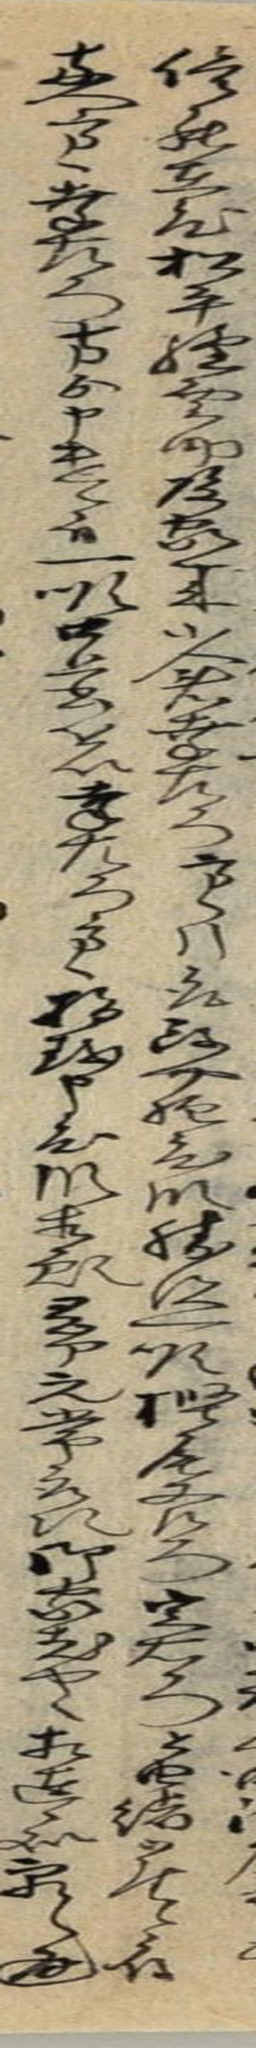両人方へ幸左衛門方ゟ申遣候ニ付一順口上書を以幸左衛門方へ指越申度段相願岡部元常取次御家老中ヘ相達候処願之通
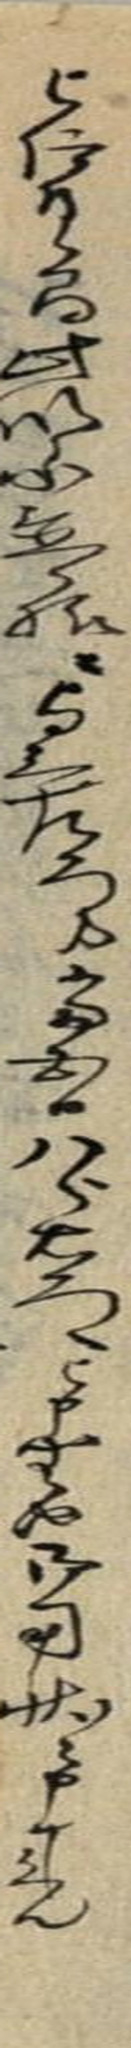被仰付候間此段承置候様ニ与三左衛門方当五日八郎右衛門へ被聞候由御用状ニ申来ル
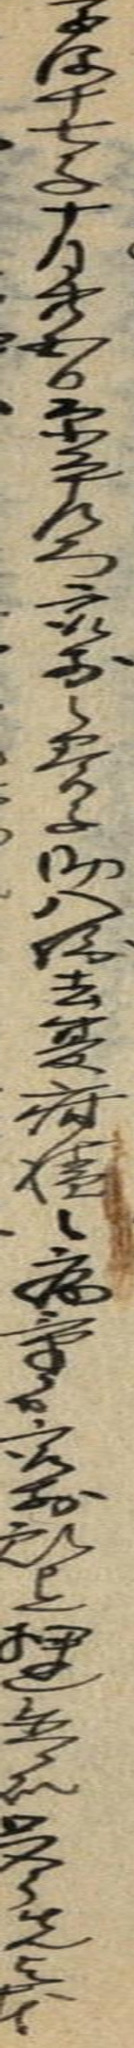一享保十七子十月廿五日原平左衛門最前之養子助八儀去夏疳積之病気ニ付最前願申上押込置候処只今洗与本
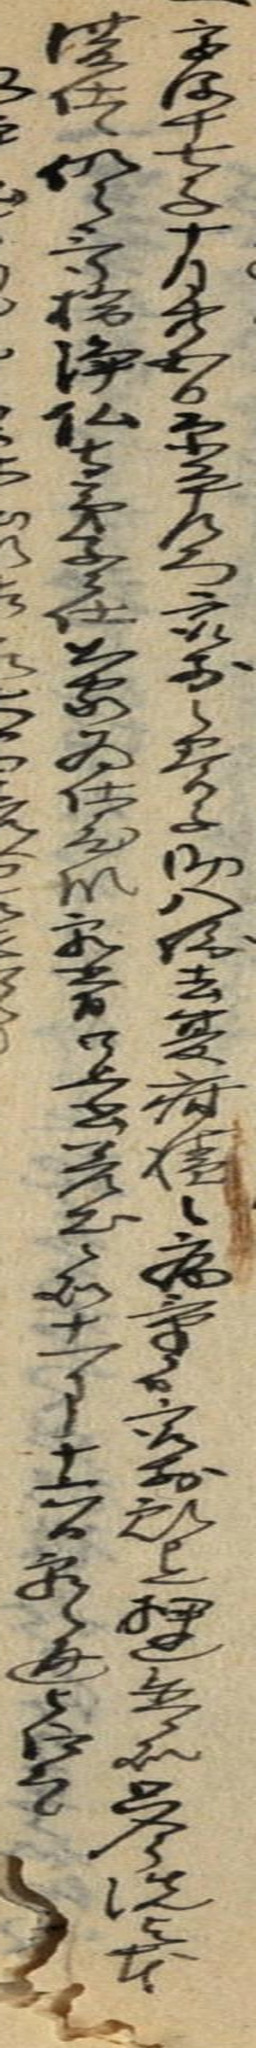復仕候仍之三ツ橋浄仏寺弟子ニ仕出家為仕度段願書付差出候処十一月十六日願之通被仰出候
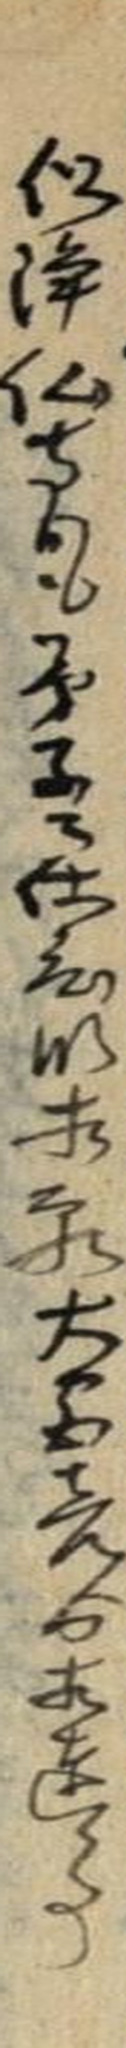但浄仏寺ゟも弟子ニ仕度段相願大宮彦右衛門ゟ相達候事
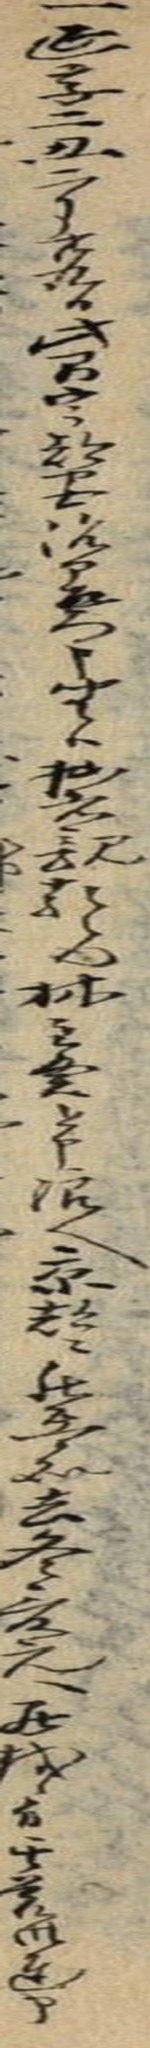一延享二丑二月廿九日此間宇都宮治部左衛門申聞候ハ拙者親類之内林主殿と申浪人京都ニ罷在候処去冬爰元へ罷越候ニ付其節御達申
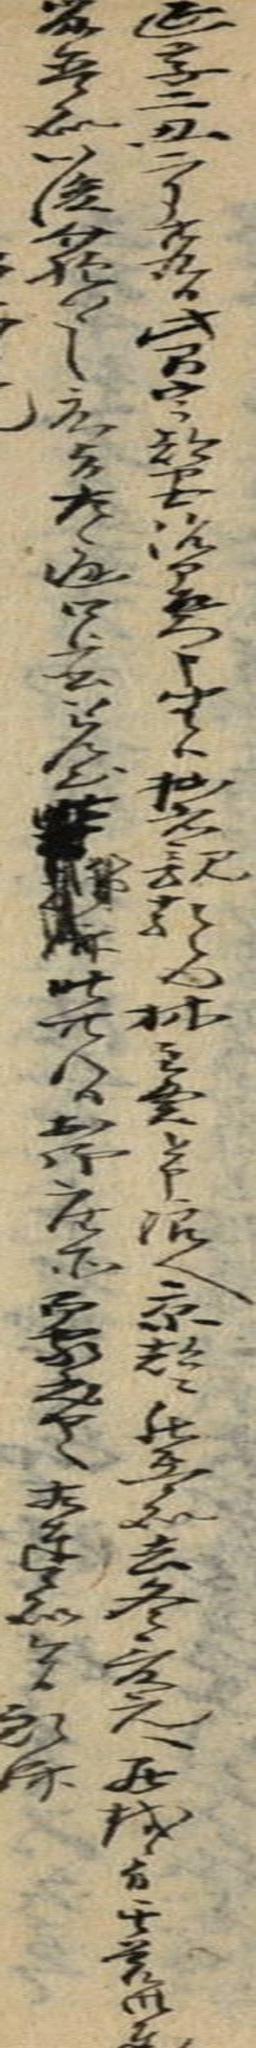留置候処以後介抱いたし度旨左之通口上書差出昨廿八日於御座所御家老中へ相達候処今日願済
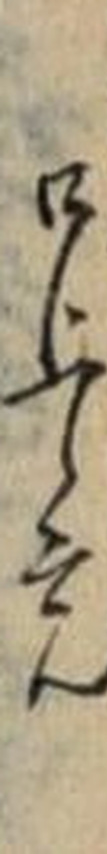口上之覚
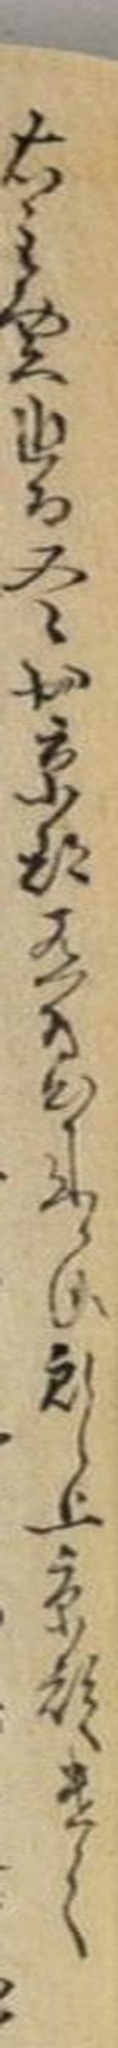右主殿追而又々京都有出来候趣願之上京都へ遣之
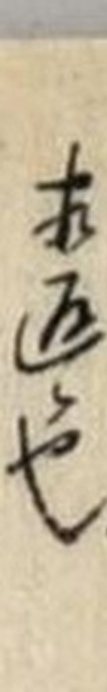相返候也
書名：養子縁組之部
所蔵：福井県文書館 Fukui Prefectural Archives
